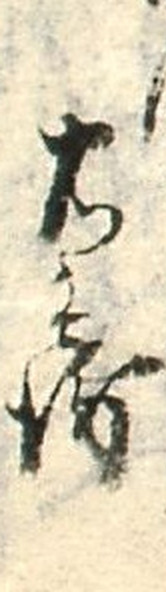忠兵衛
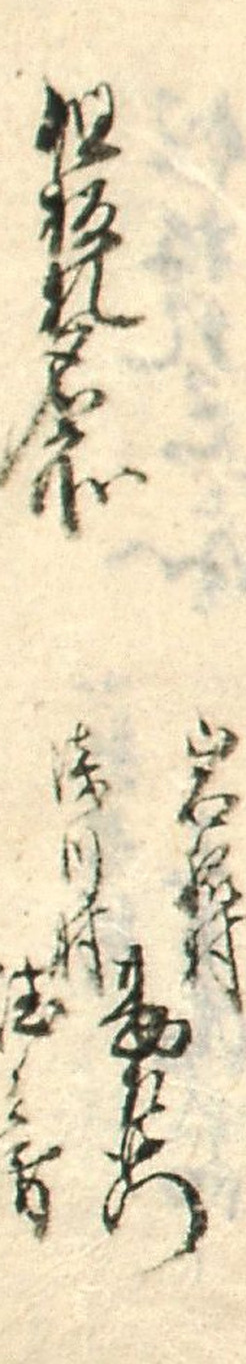但板札名前浅川村徳兵衛

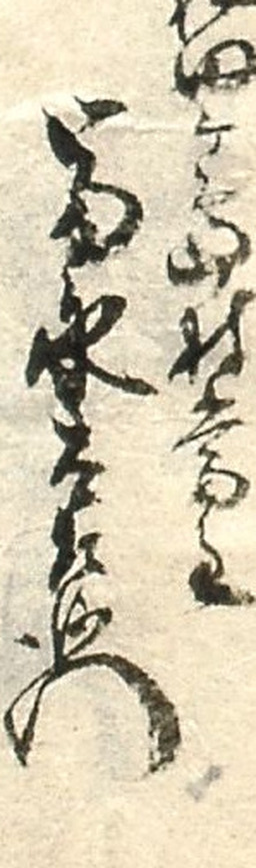富永太左衛門

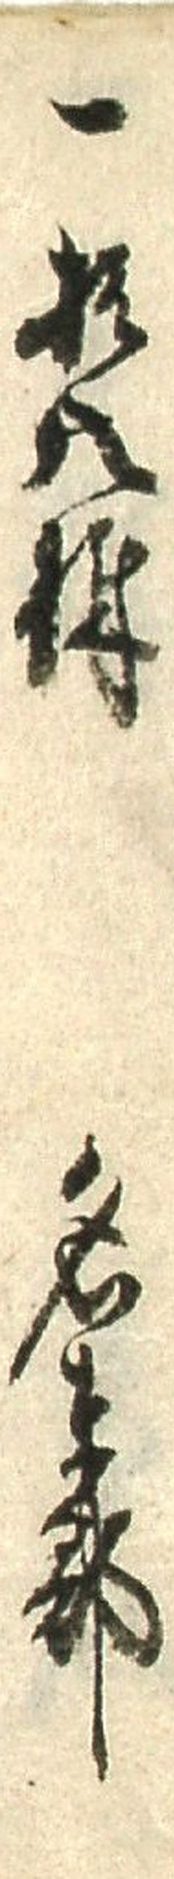一十八株名東郡
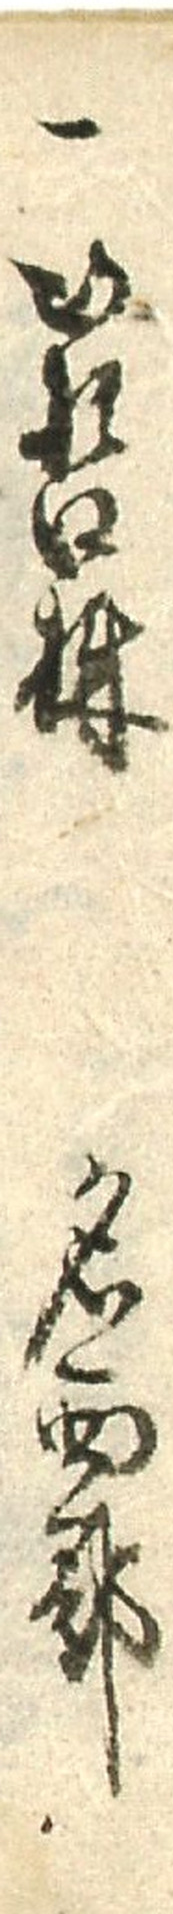一二十四株名西郡
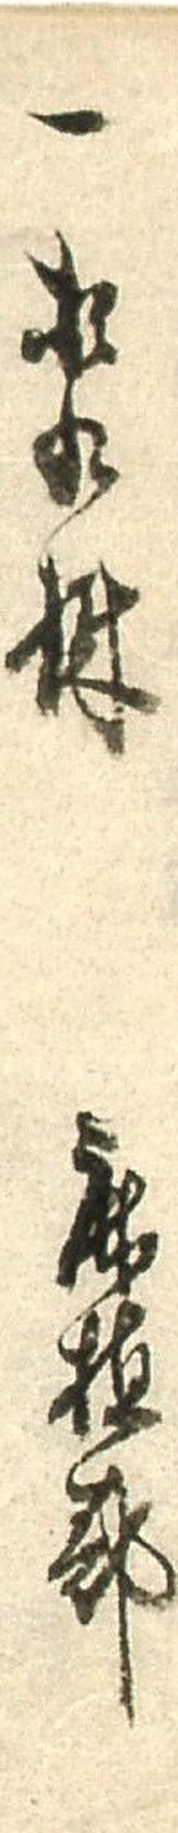一十九株麻植郡
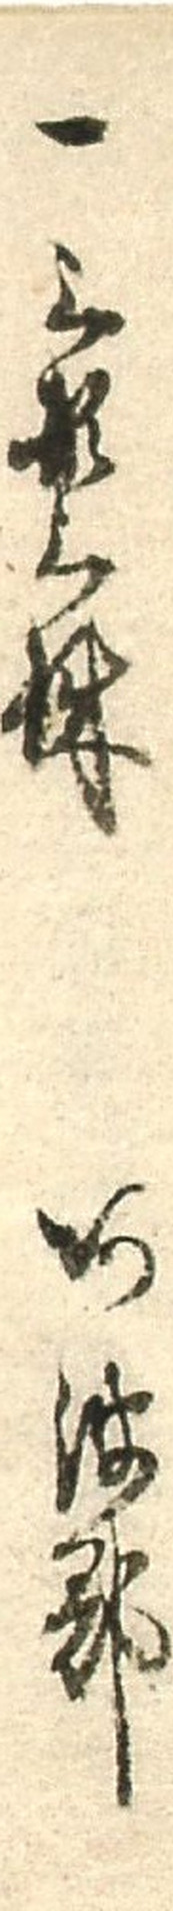一三十三株阿波郡
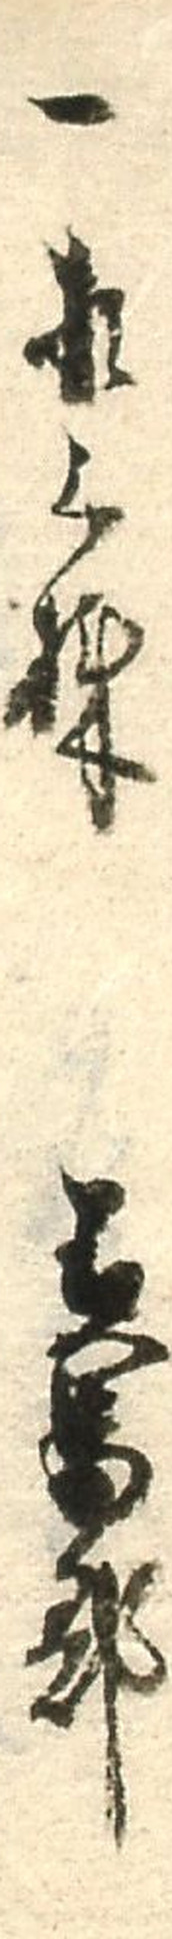一十三株美馬郡
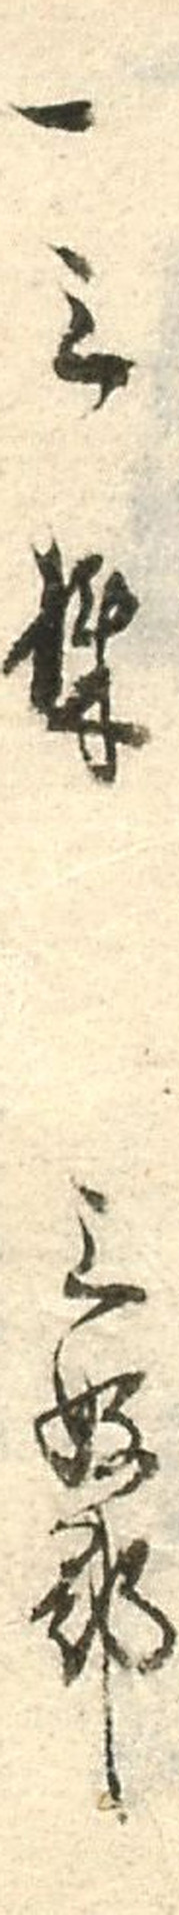一三株三好郡
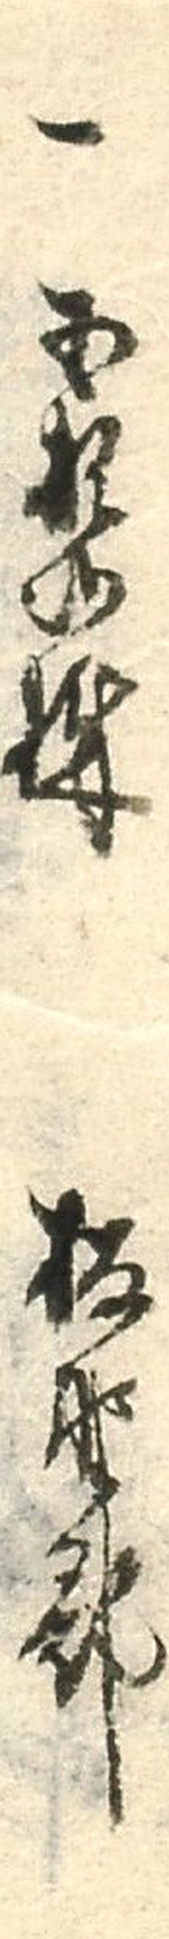一五十二株板野郡
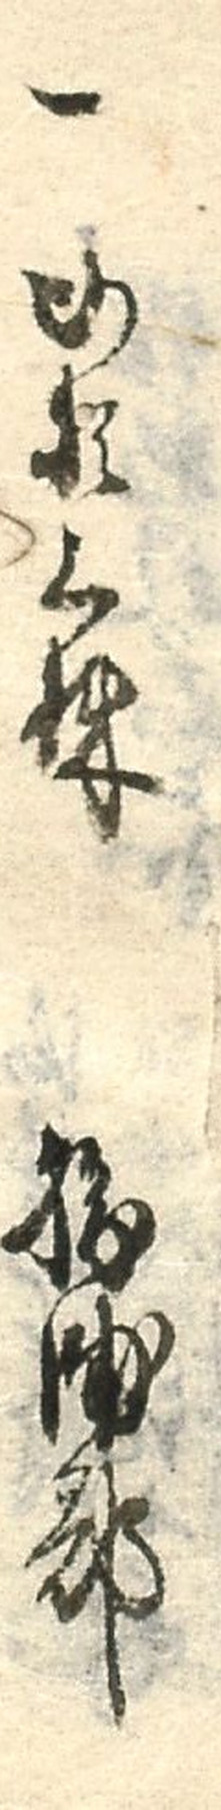一二十三株勝浦郡
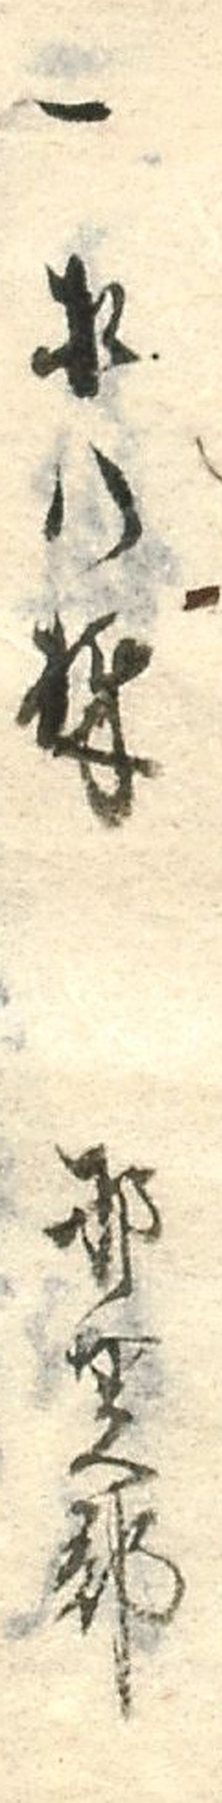一十八株那賀郡
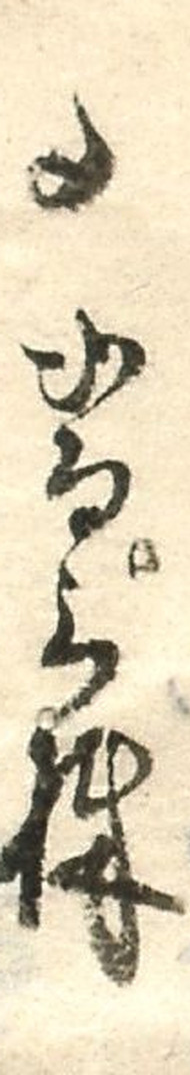〆二百三株
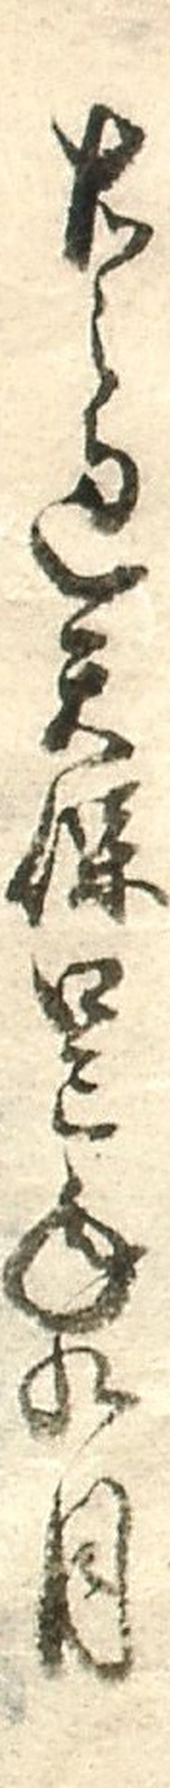右之通天保四巳年九月
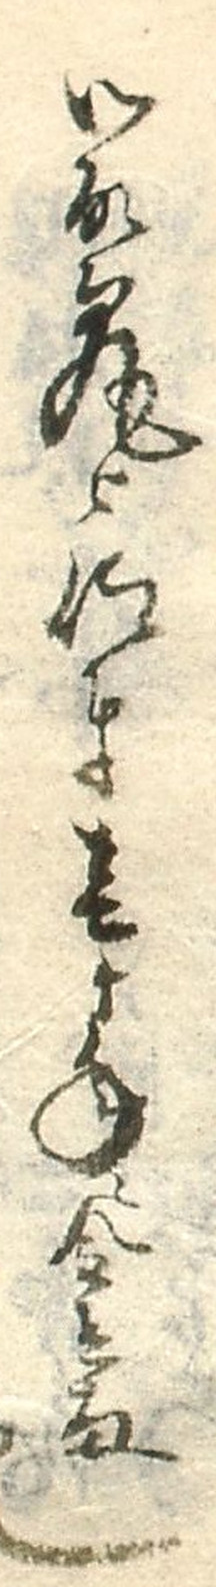御取究被仰付一ヶ年に金一両宛
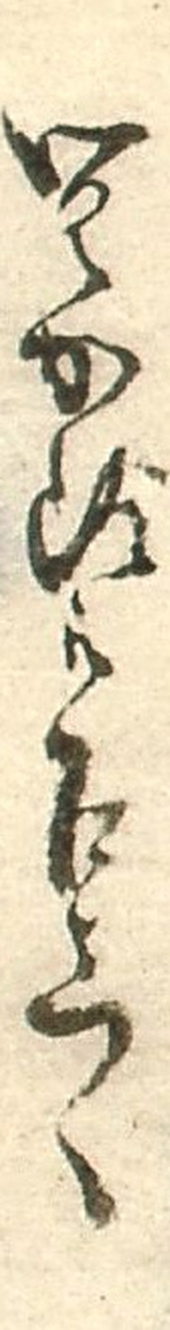冥加銀被召上候
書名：郷酒株絞油株質屋株御取窮郡中名面帳並諸郡株数相改帳
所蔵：鳴門教育大学 Naruto University of Education
